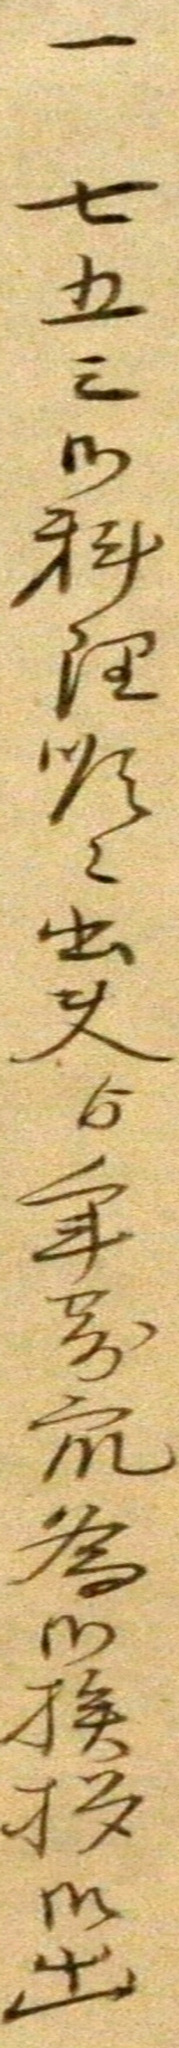一七五三御料理順々出夫ゟ年寄衆為御挨拶御出
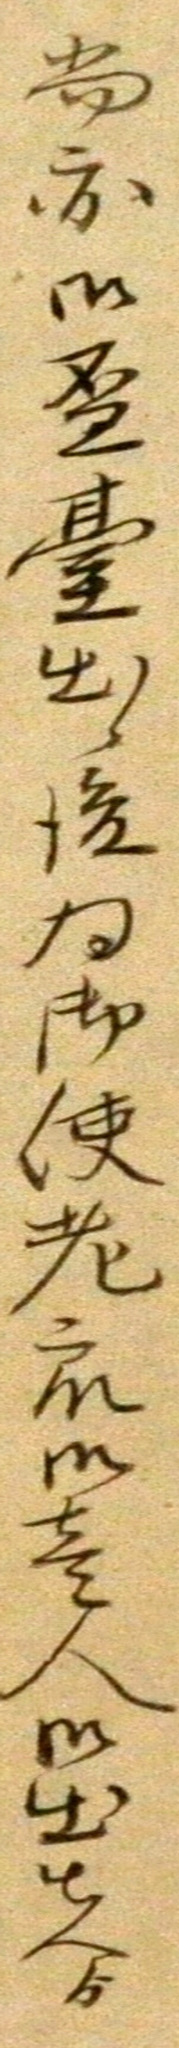尚亦御盃臺出候後為御使老衆御壱人御出先ゟ
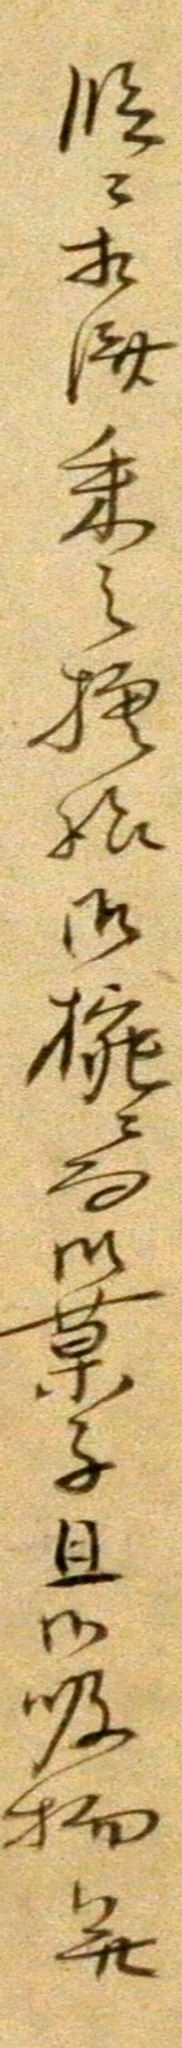段々相済朱之模様御椀ニ而御菓子且御吸物并
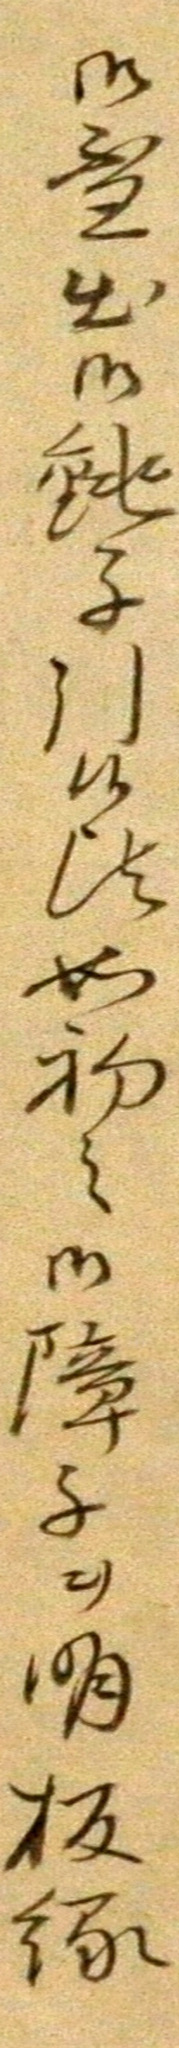御盃出御銚子引候頃如初之御障子ヲ明板縁
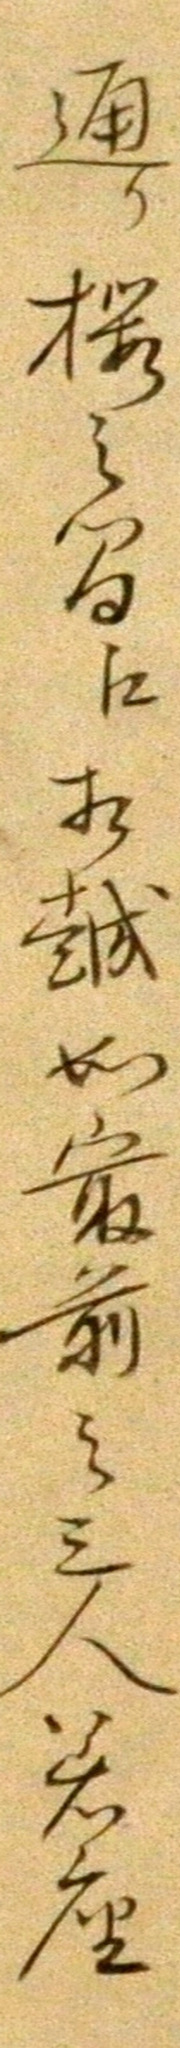通り桜之間え相越如最前之三人着座
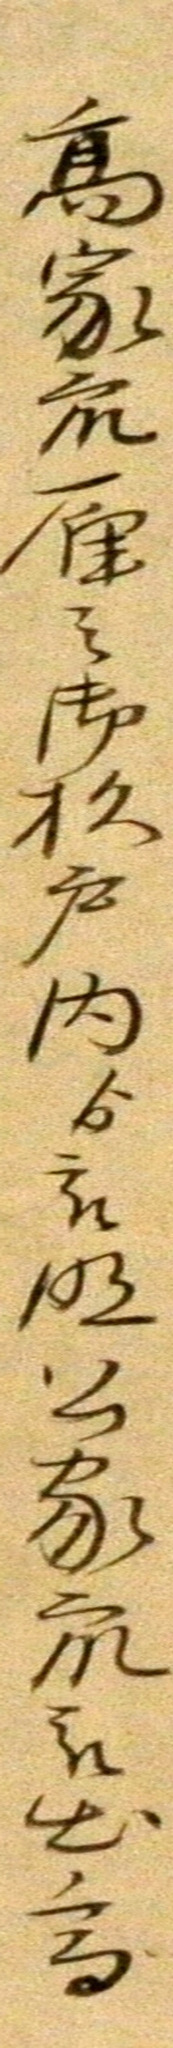一高家衆鳫之御杦戸内ゟ被明公家衆被出高
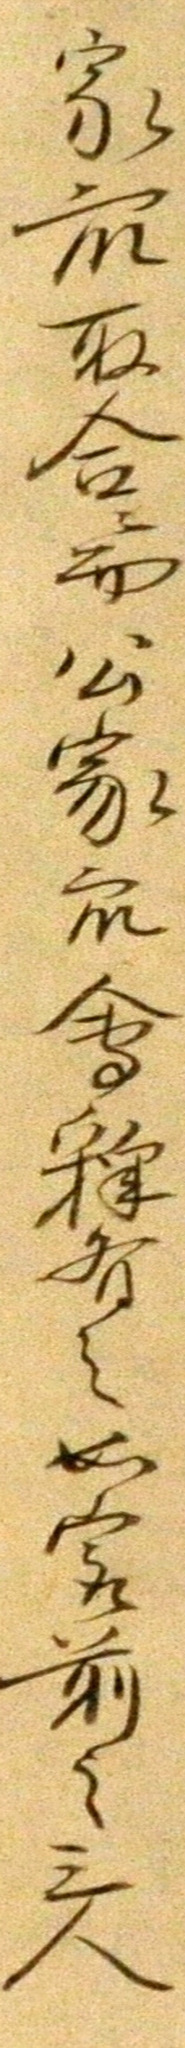家衆取合ニ而公家衆會釋有之如最前之三人
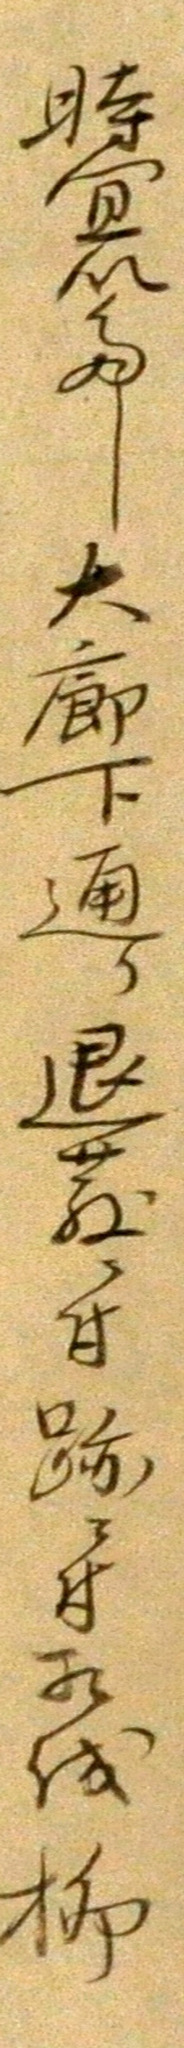時宜いたし大廊下通り退散ニ付跡ニ付相越栁
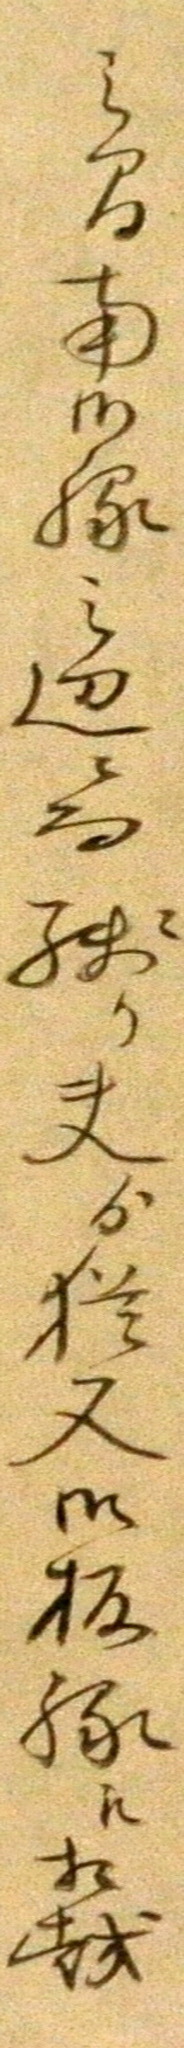之間南御縁之辺ニ而残り夫ゟ猶又御板縁え相越
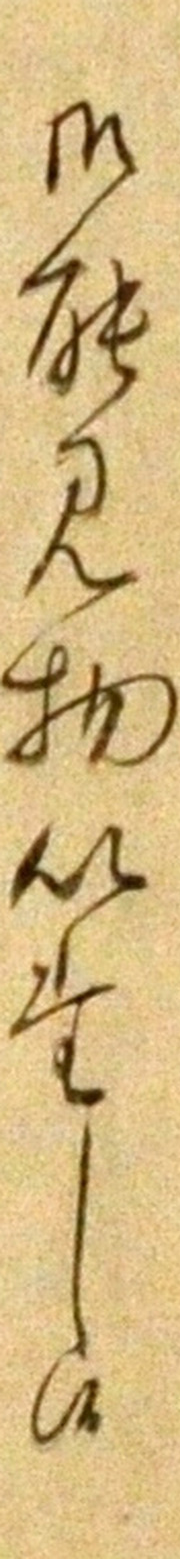御能見物いたし候
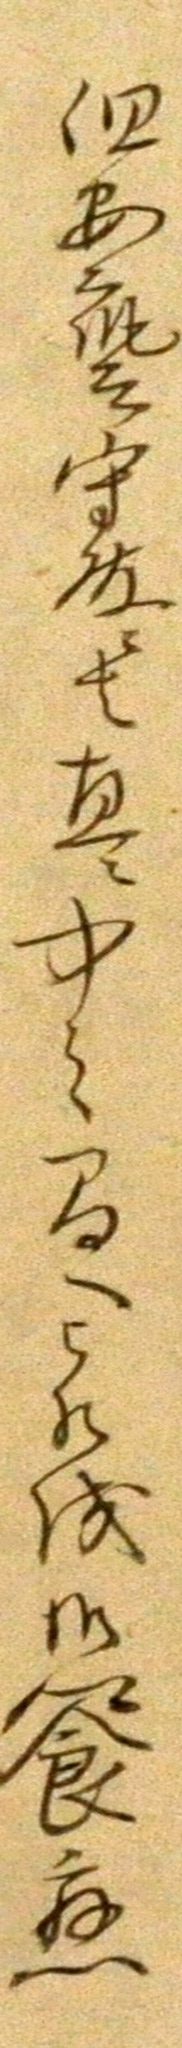但安藝守殿には直ニ中之間へ被相越御饗應
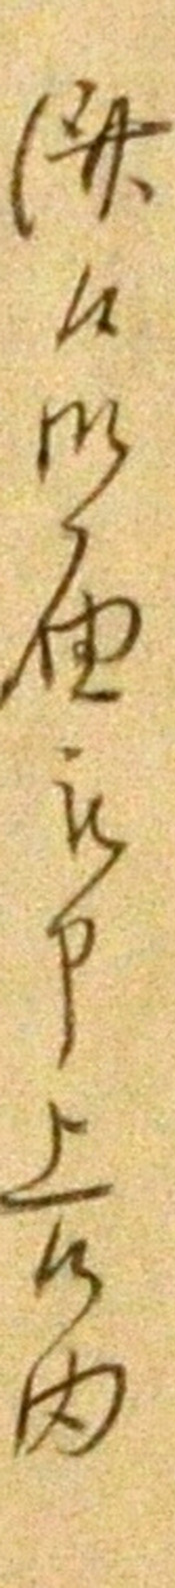済候御届被申上候内
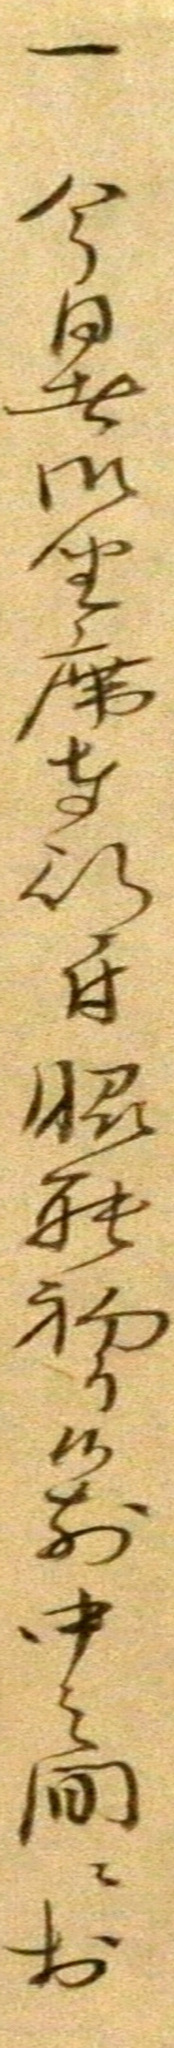今日は御座席奉行ニ付脇能初り候前中之間ニお
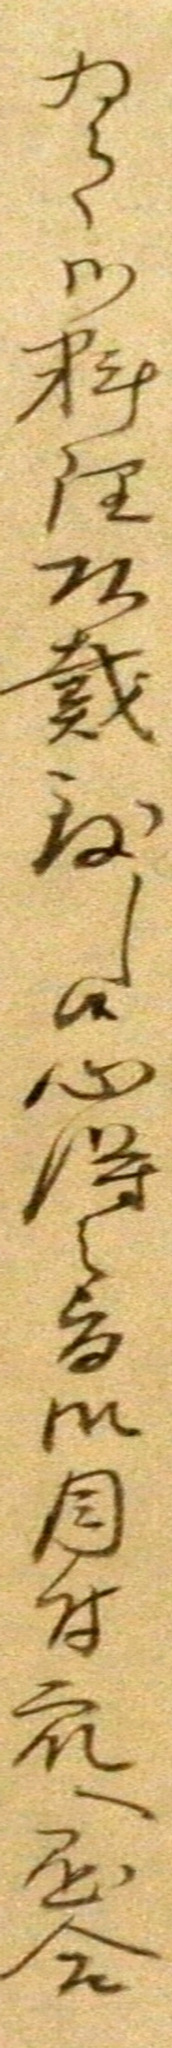ゐて御料理頂戴致し候心得之旨御目付衆へ懸合

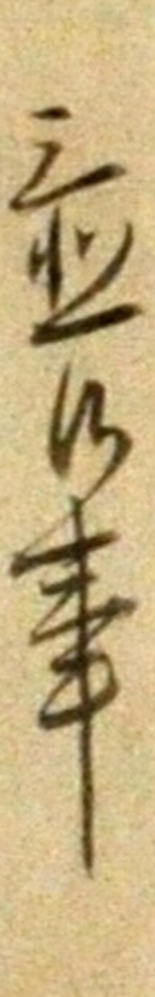置候事
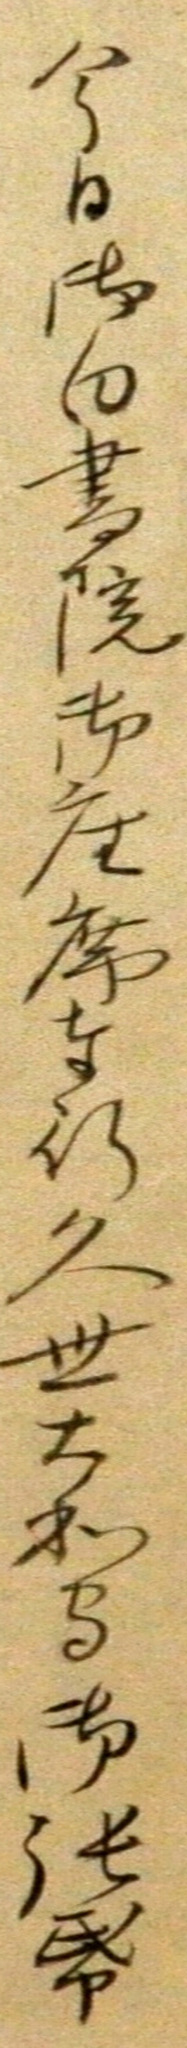一今日御白書院御座席奉行久世大和守御張紙
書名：御白書院御座席奉行勤方留外
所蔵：伊那市立高遠町図書館・合同会社AMANE
